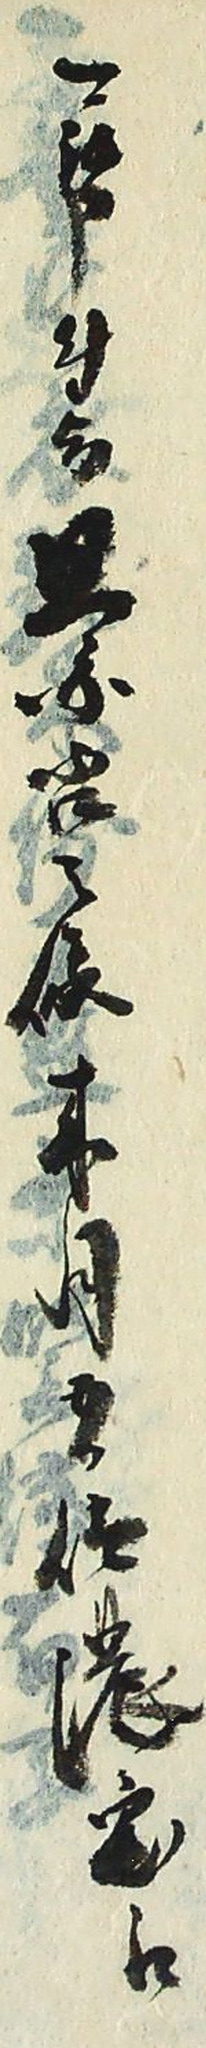可被申付旨且亦否之儀来月五日信濃宅江
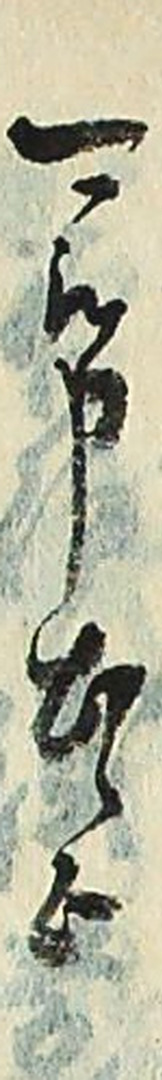可被申出候以上
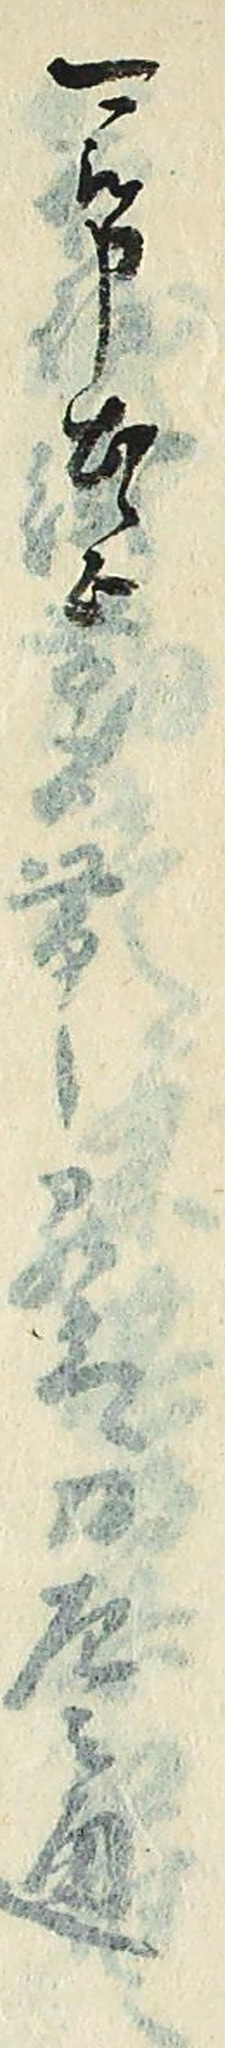可被申出候以上
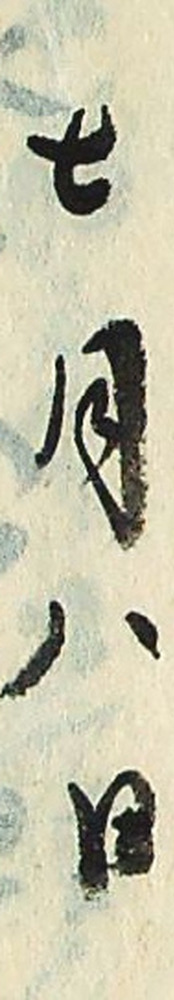七月八日
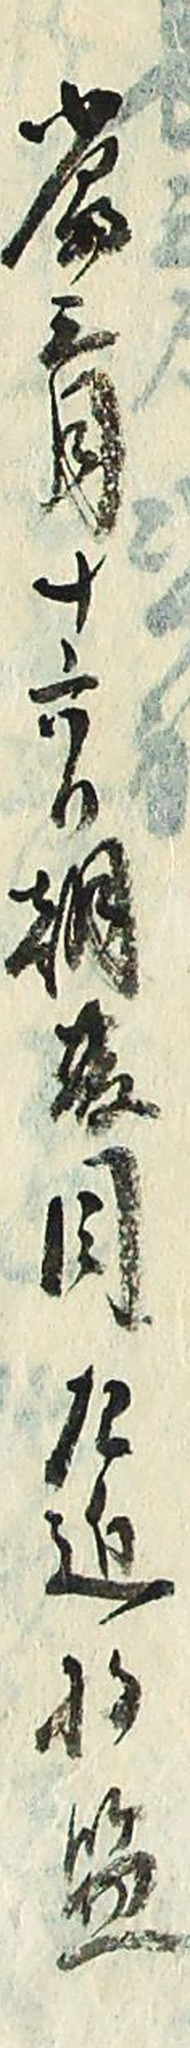当三月十六日朝夏目左近将監
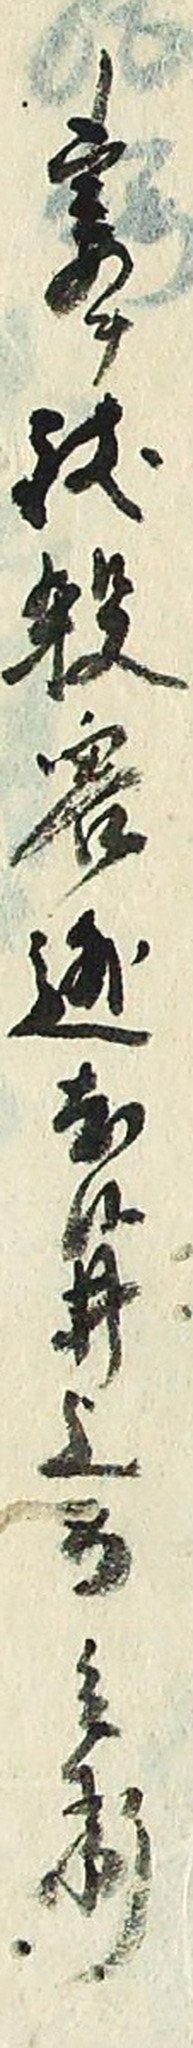妻を致殺害逃去候井上兵衛
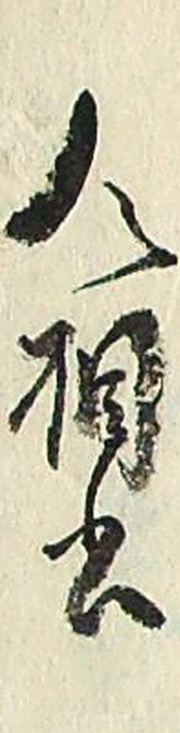人相書

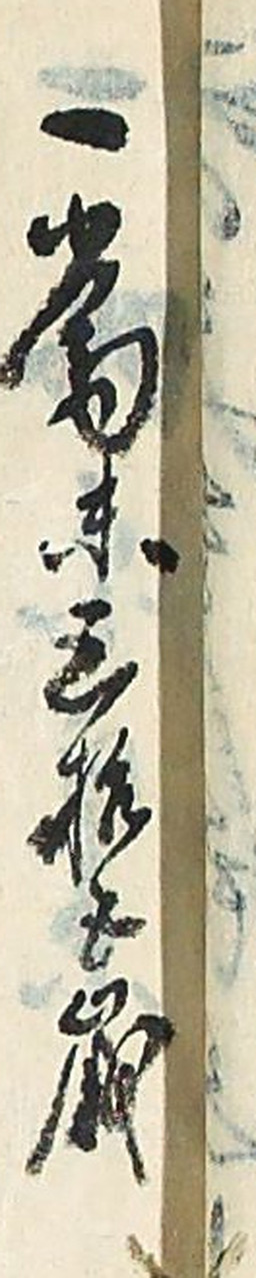一当未三拾五歳
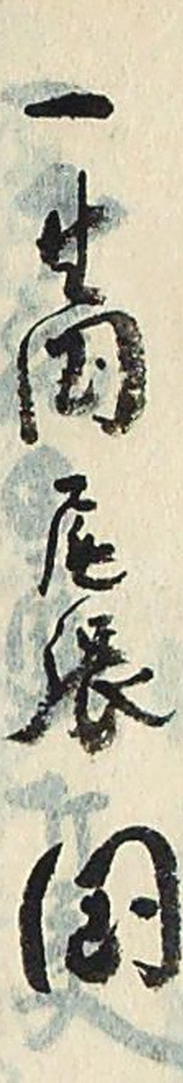一生国尾張国
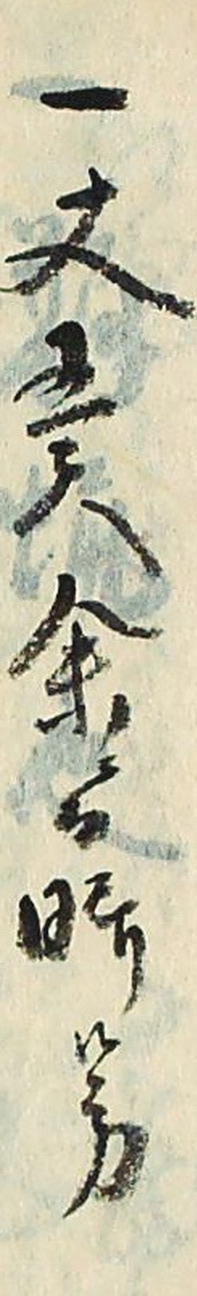一丈五尺余に而肥り候方
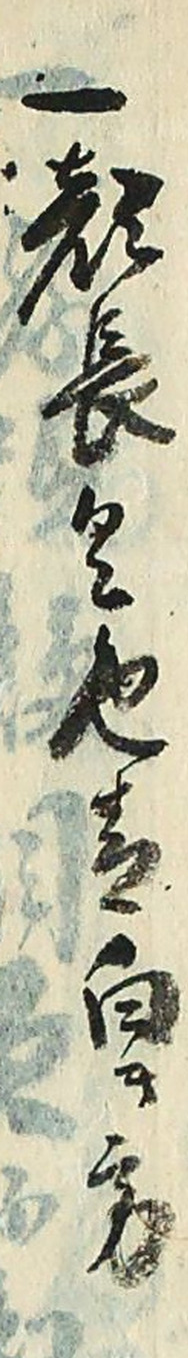一顔長く色青白き方
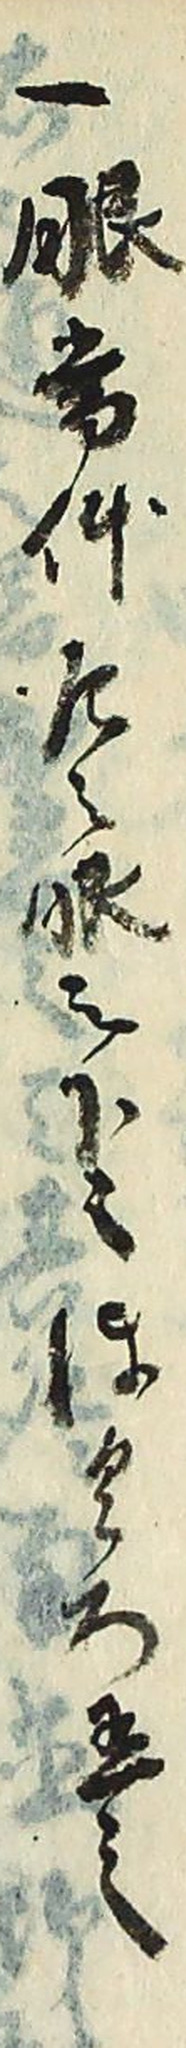一眼常体左之眼之下にほくろ有之
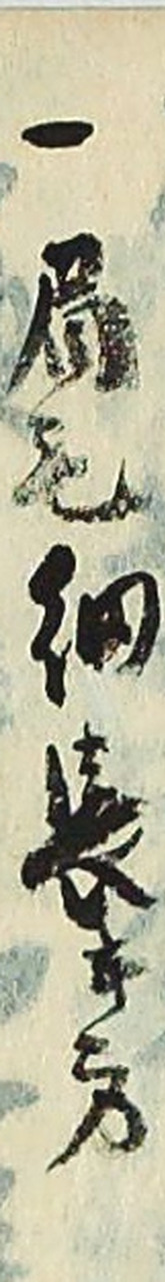一眉毛細長き方
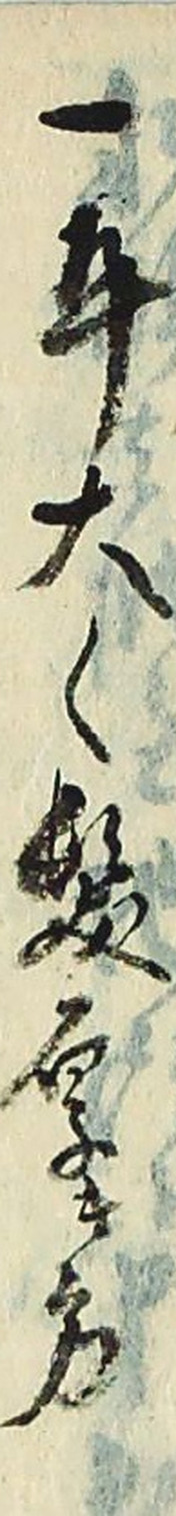一耳大く髪厚き方
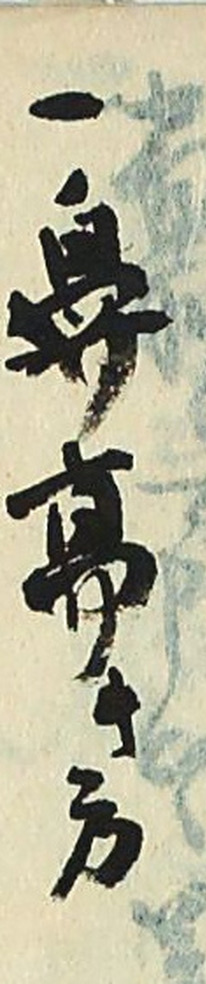一鼻高き方
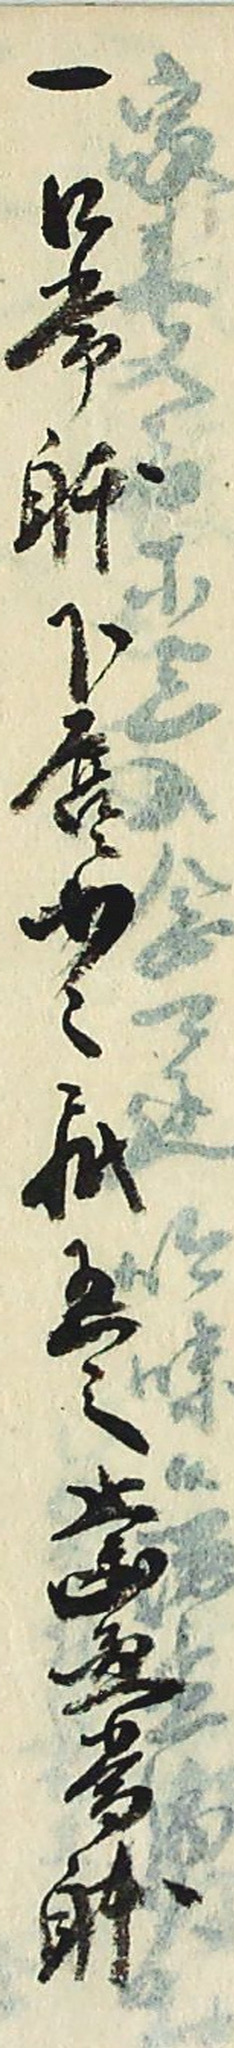一口常体下唇に少々疵有之候歯並常体
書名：諸御用御□受書控
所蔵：鳴門教育大学 Naruto University of Education
